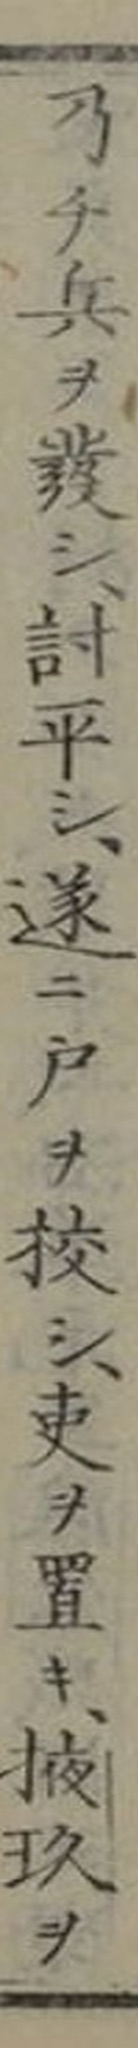乃チ兵ヲ発シ、討平シ、遂ニ戸ヲ校シ、吏ヲ置キ、掖玖ヲ
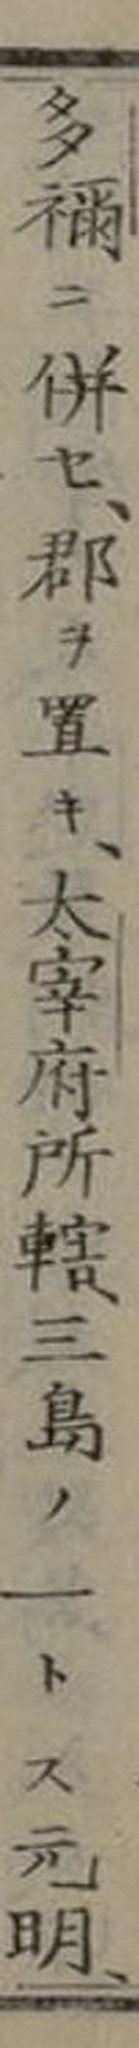多禰ニ併セ、郡ヲ置キ、太宰府所轄、三島ノ一トス元明、
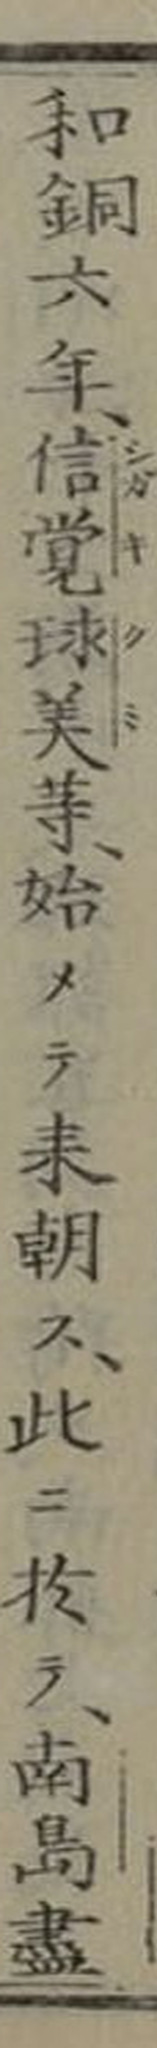和銅六年、信覚球美等、始メテ来朝ス、此ニ於テ、南島尽
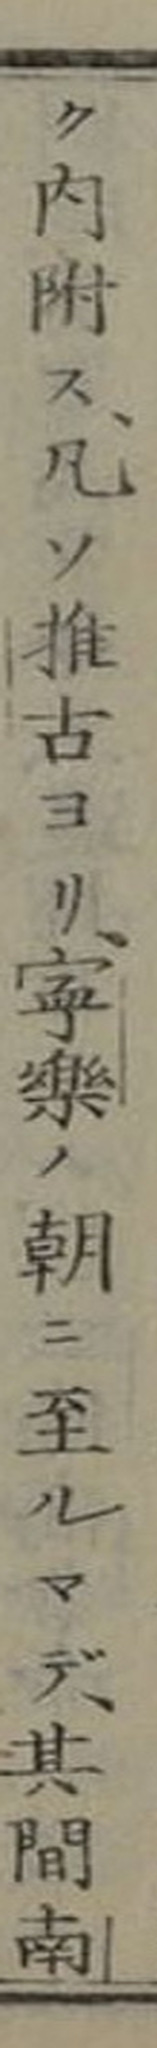ク内附ス、凡ソ推古ヨリ、寧楽ノ朝ニ至ルマデ、其間南
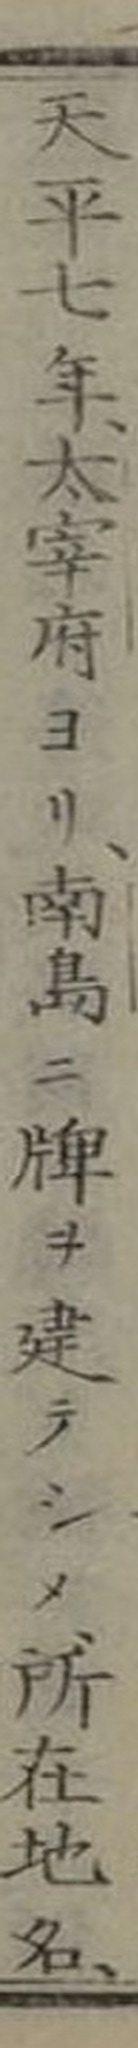天平七年、太宰府ヨリ、南島ニ牌ヲ建テシメ、所在地名、
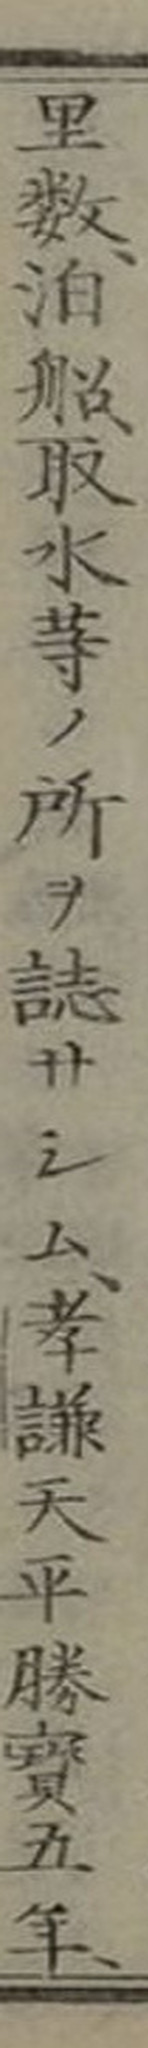里数、泊船、取水等ノ所ヲ誌サシム、孝謙天平勝宝五年、
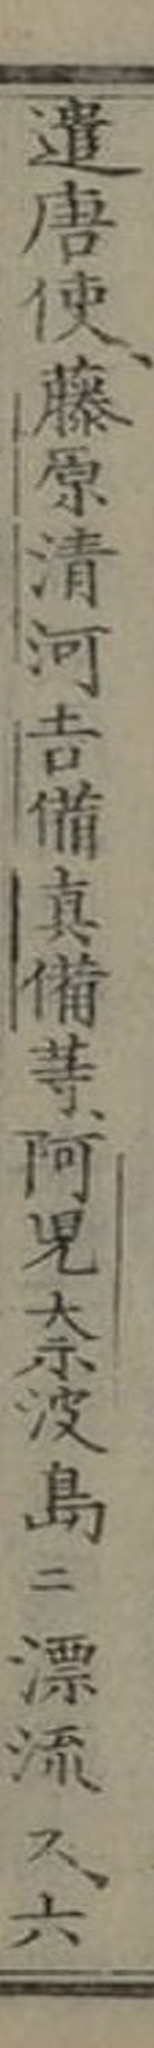遣唐使、藤原清河吉備真備等、阿児奈波島ニ漂流ス、六

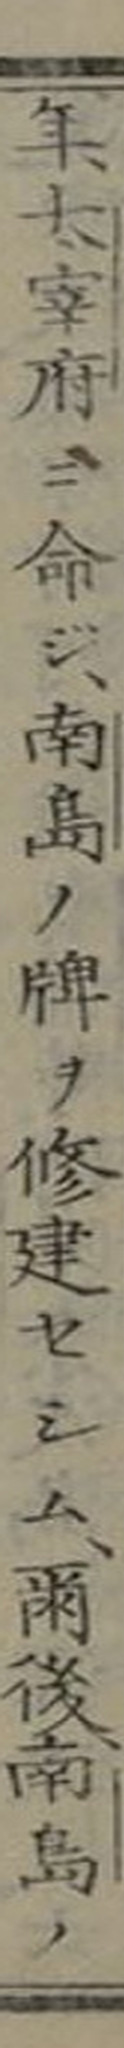年、太宰府ニ命ジ、南島ノ牌ヲ修建セシム、爾後、南島ノ
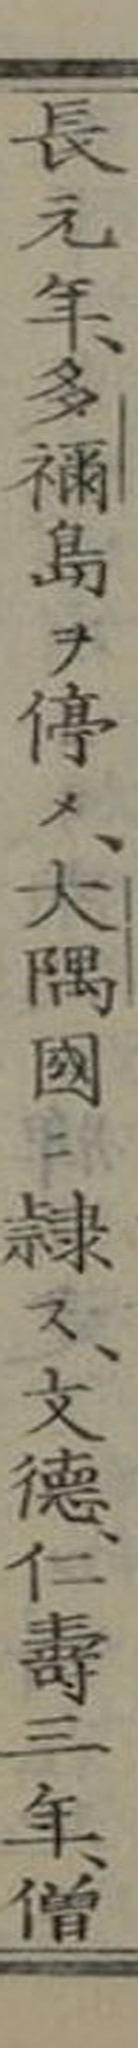長元年、多禰島ヲ停メ、大隅国ニ隷ス、文徳、仁寿三年、僧
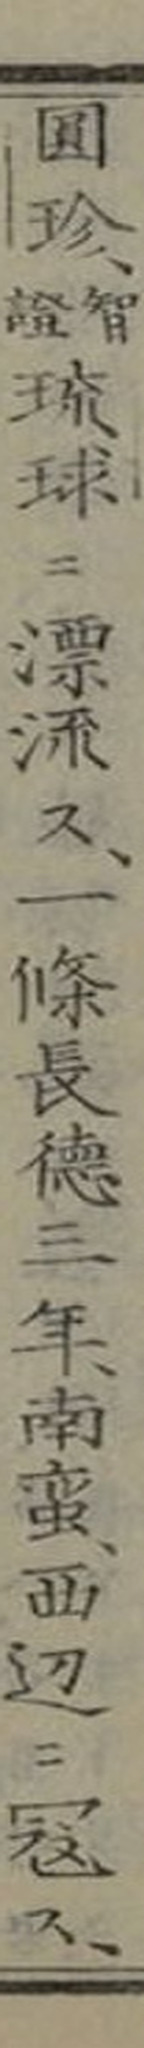円珍、智証琉球ニ漂流ス、一条長徳三年、南蛮、西辺ニ冠ス、
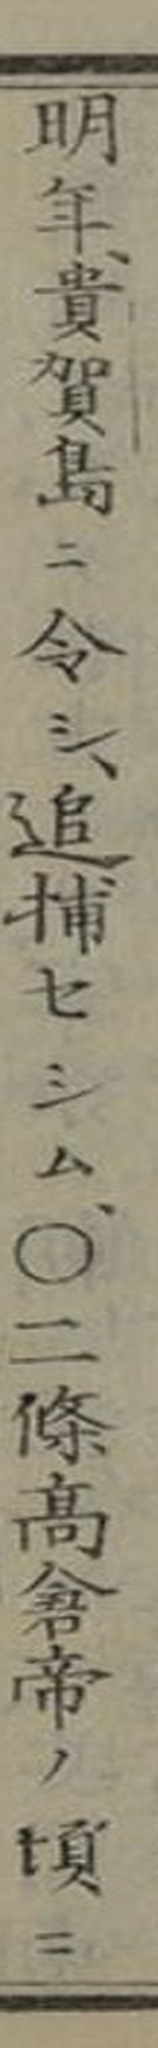明年、貴賀島ニ令シ、追捕セシム、○二条高倉帝ノ頃ニ
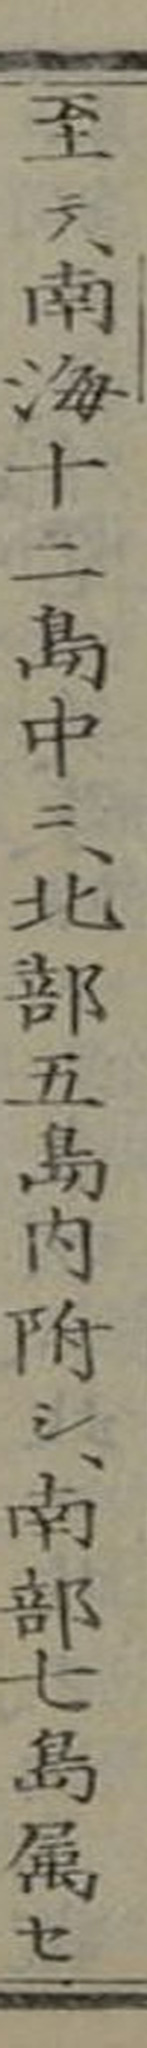至テ、南海十二島中ニ、北部五島内附シ、南部七島属セ
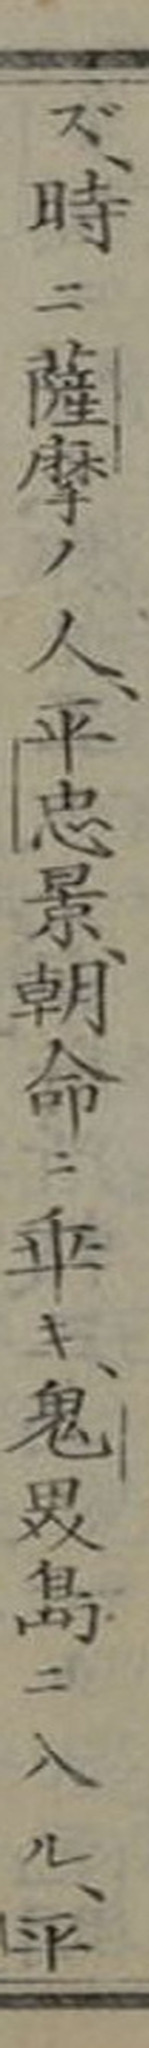ズ、時ニ薩摩ノ人、平忠景、朝命ニ乖キ、鬼界島ニ入ル、平
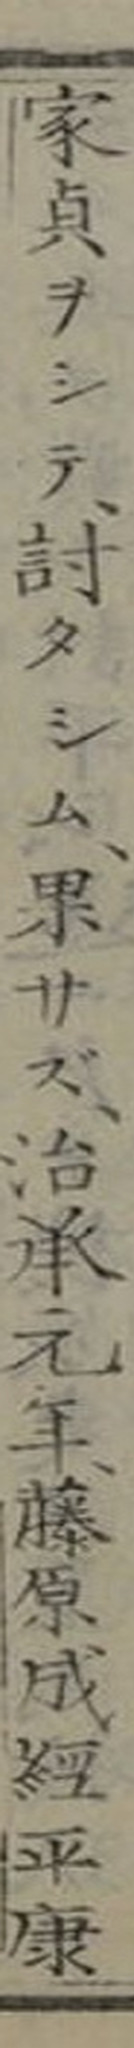家貞ヲシテ、討タシム、果サズ、治承元年、藤原成経平康
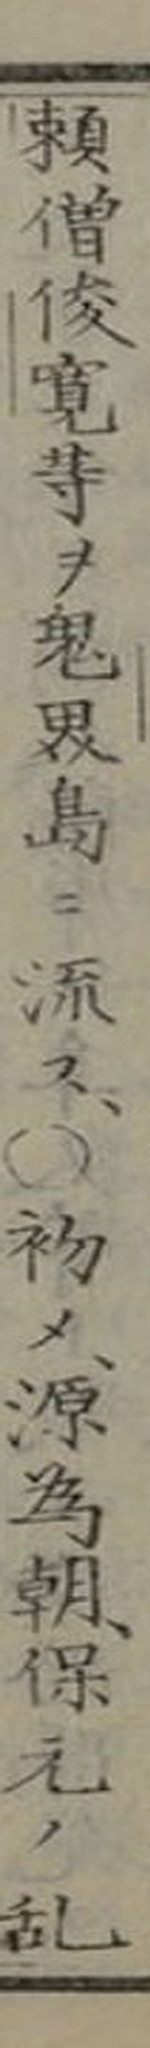頼僧俊寛等ヲ鬼界島ニ流ス、○初メ、源為朝、保元ノ乱
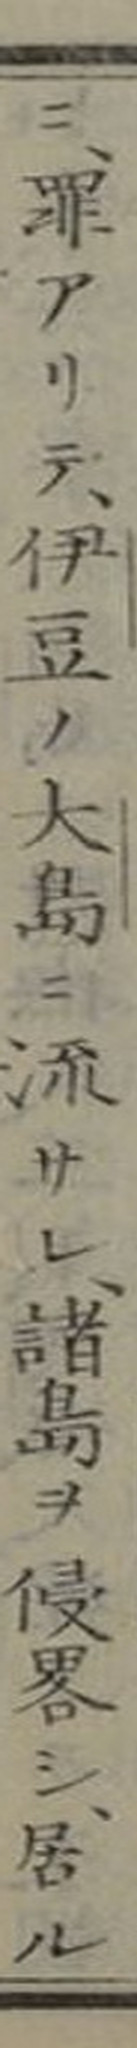ニ、罪アリテ、伊豆ノ大島ニ流サレ、諸島ヲ侵略シ、居ル
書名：琉球新誌 図附 上
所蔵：University of the Ryukyus Library
